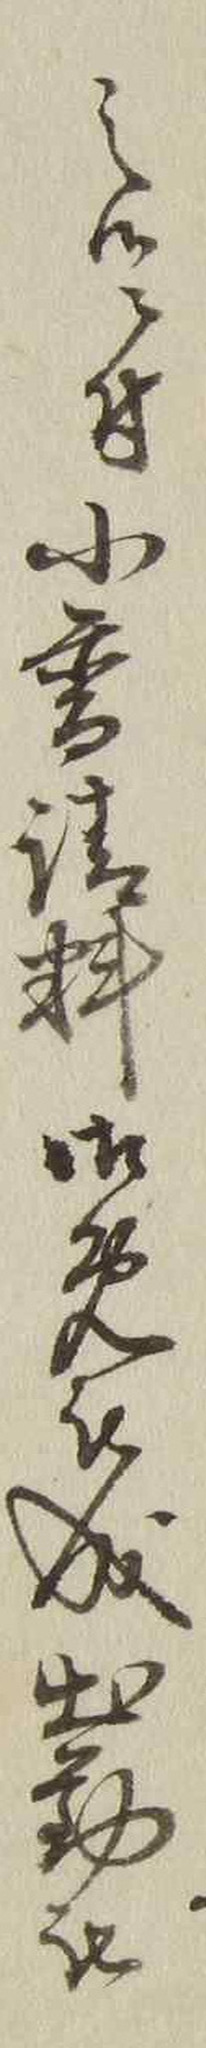之候ニ付小普請料御免被成出勤被
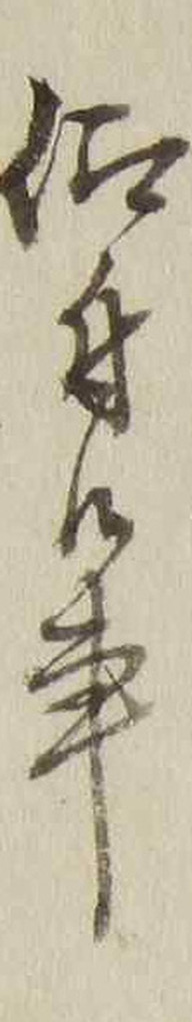仰付候事
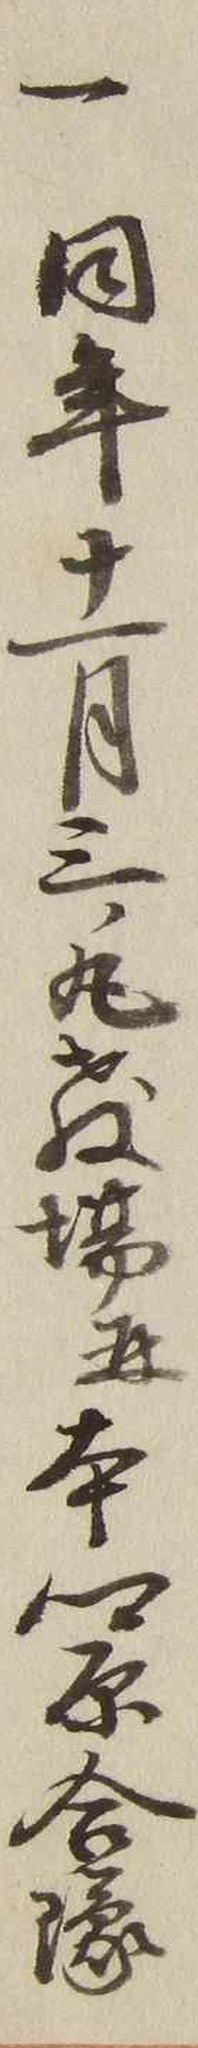一同年十一月三ノ丸教場并本郷原合隊

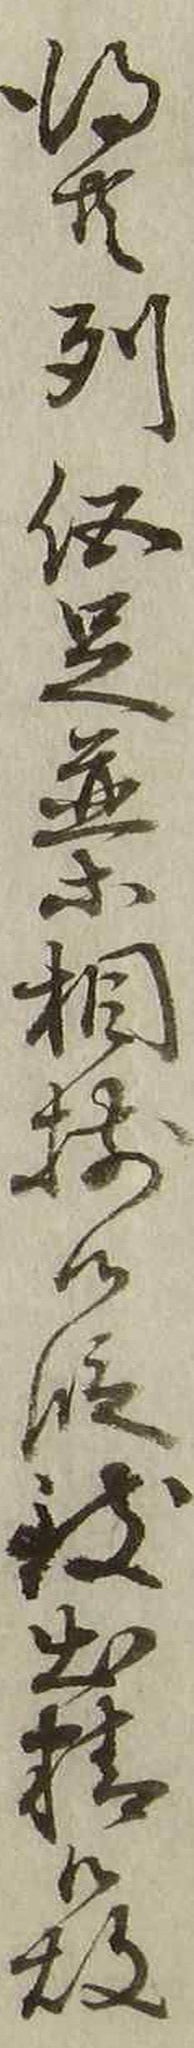得共列伍足並等相揃候段致出精候故
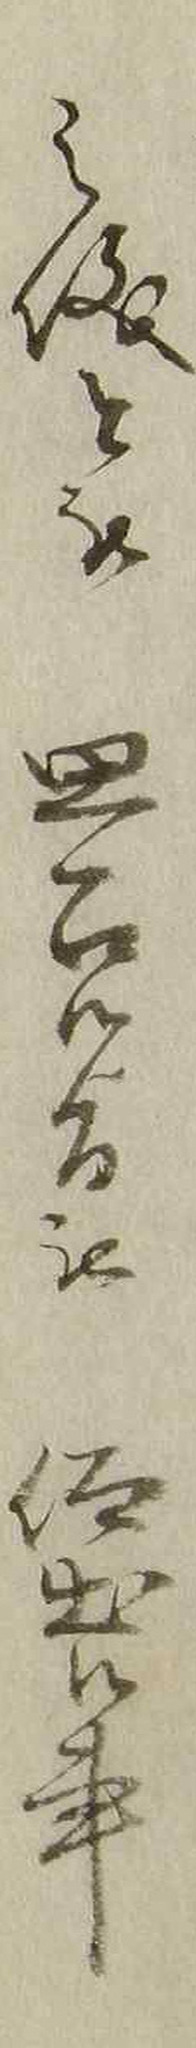之儀と被思召候旨被仰出候事
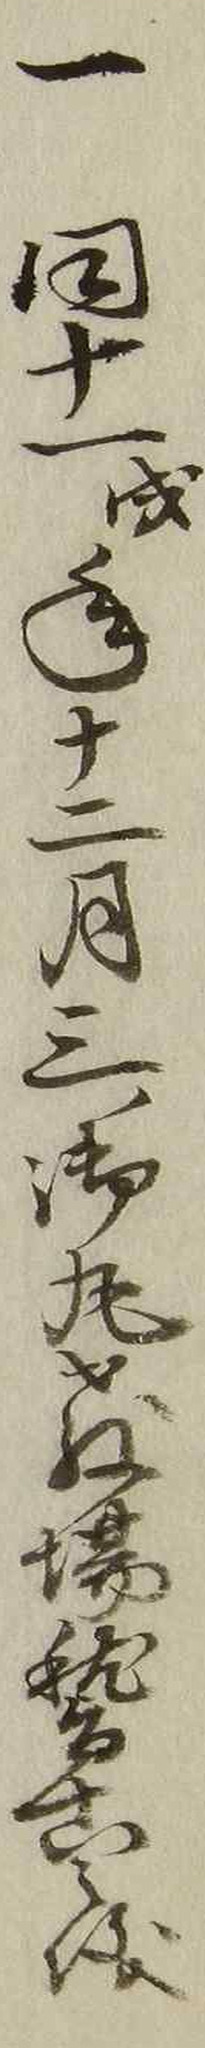一同十一戌年十二月三ノ御丸教場稽古之儀
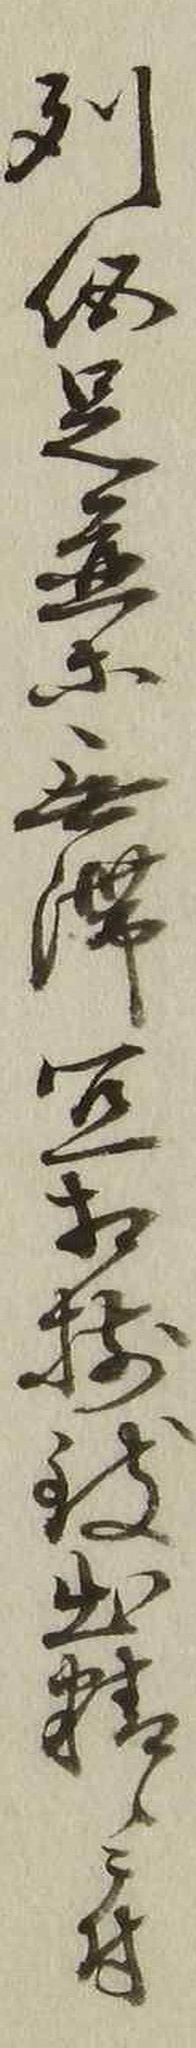列伍足並等無滞宜相揃致出精候ニ付
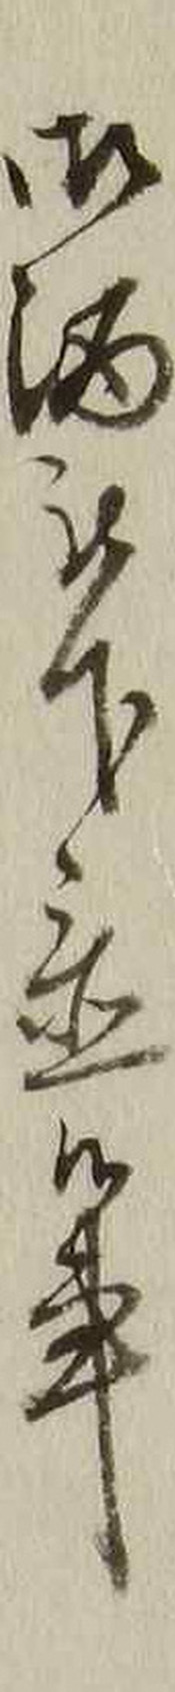御酒被下置候事
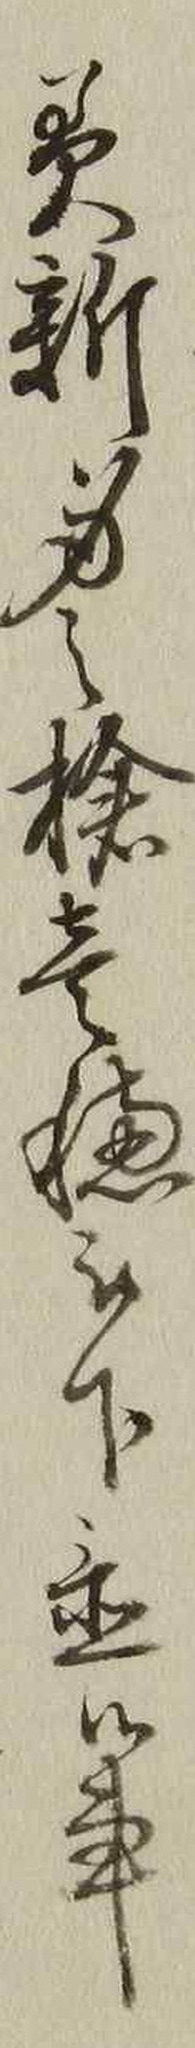美新身之槍壱穂被下置候事
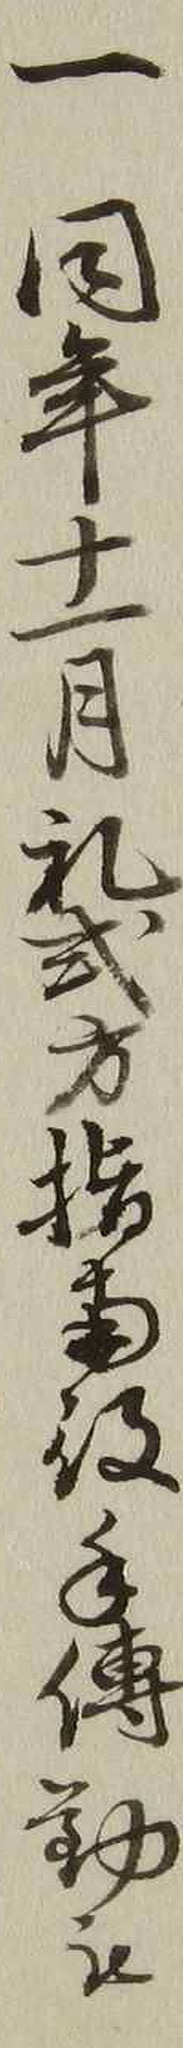一同年十一月礼式方指南役手伝勤被
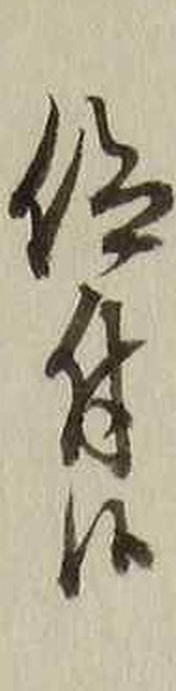仰付候
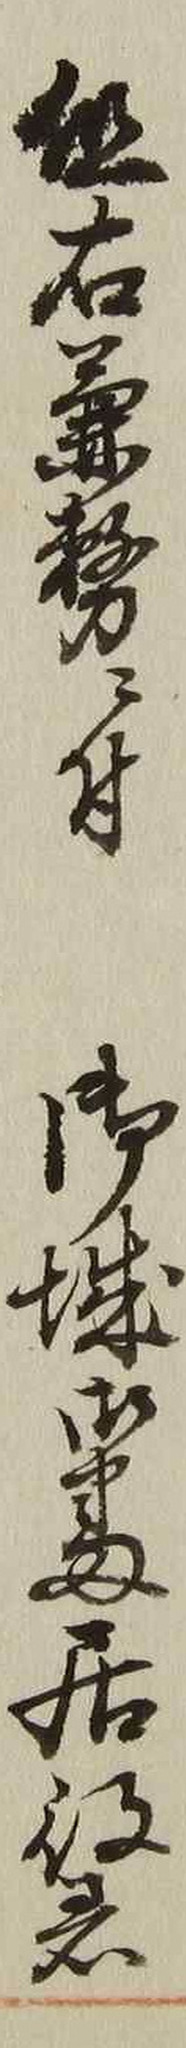但右兼務ニ付御城御番居役着
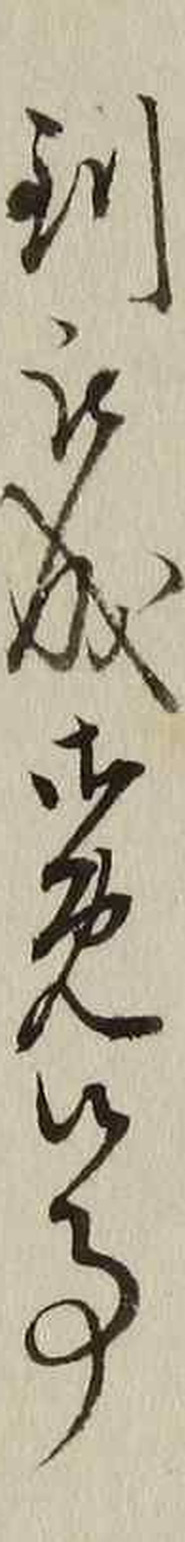到被成御免候事
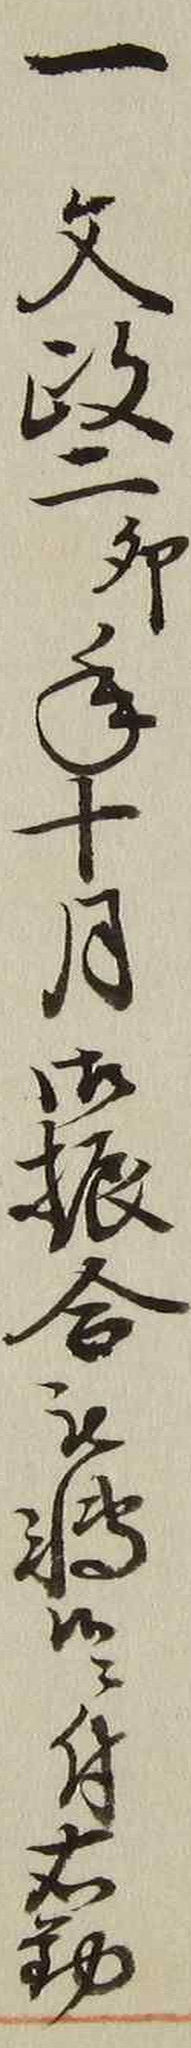一文政二卯年十月御振合被転候ニ付右勤
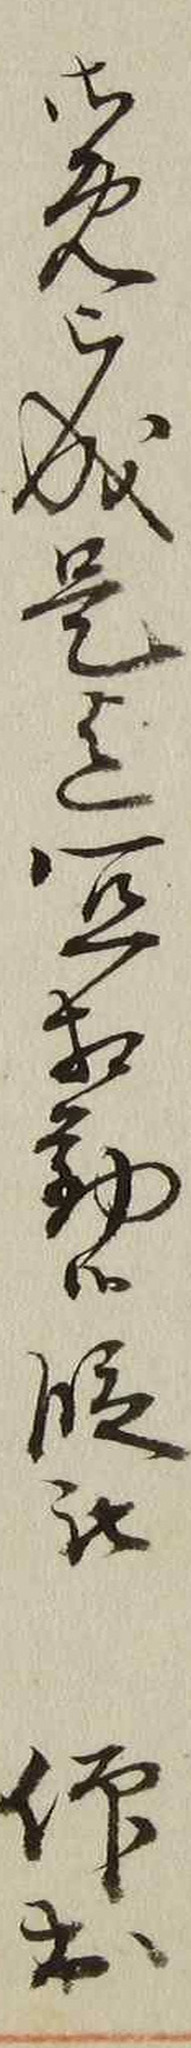御免被成是迄宜相勤候段被仰出
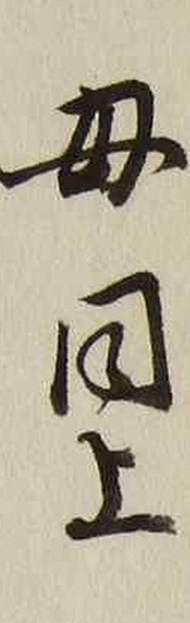母同上
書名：諸士系譜　巻之27　い之部27
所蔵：会津若松市立会津図書館
